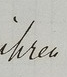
ihren
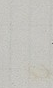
Aus
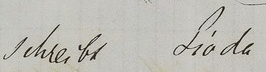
schreibt Pioda
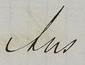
18. d. M.
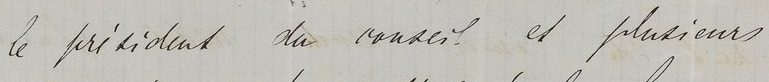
le président du conseil et plusieurs
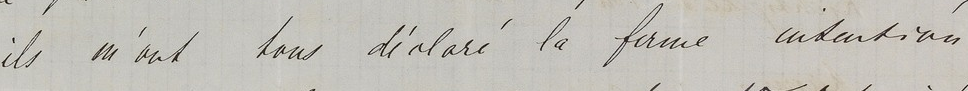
ils m'ont tous déclaré la ferme intention
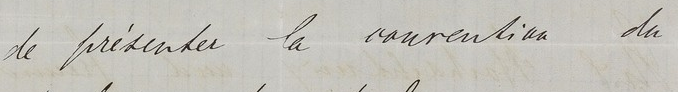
de présenter la convention du
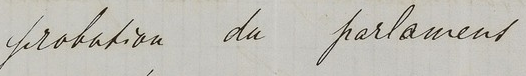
probation du parlement.
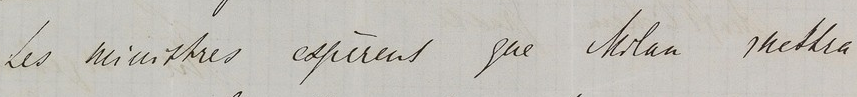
Les ministres espèrent que Milan mettra
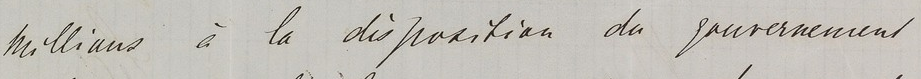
millions à la disposition du gouvernement
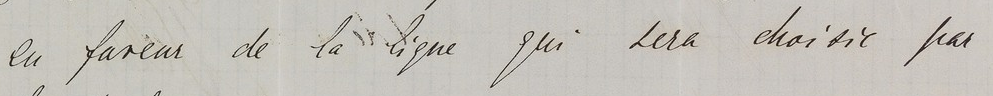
en faveur de la ligne qui sera choisie par
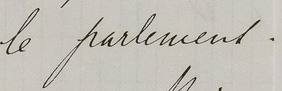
le parlement.
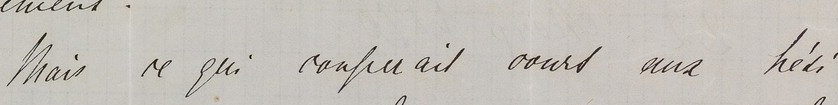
Mais ce qui couperait court aux hési-
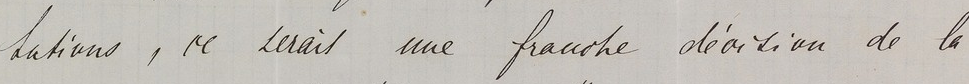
tations, ce serait une franche décision de la
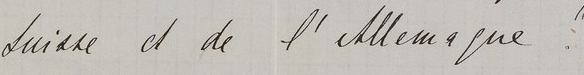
Suisse et de l'Allemagne.»
